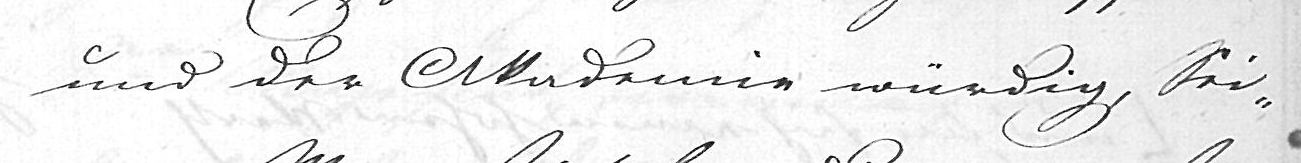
und der Akademie würdig, Sei-
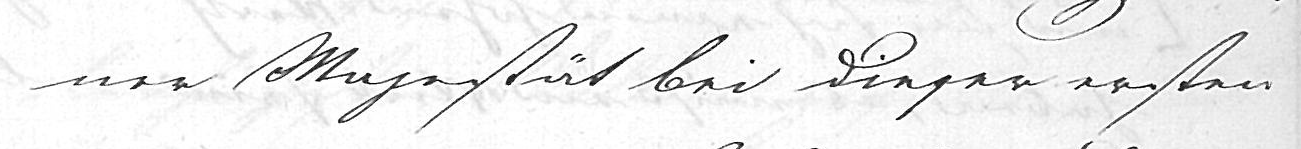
ner Majestät bei dieser ersten
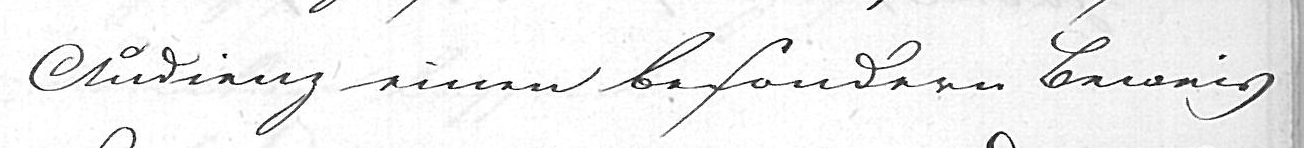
Audienz einen besonderen Beweis
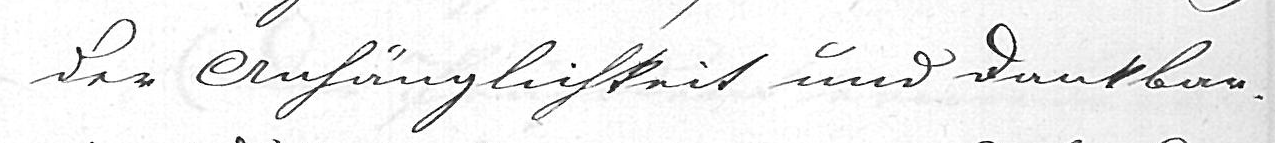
der Anhänglichkeit und Dankbar-
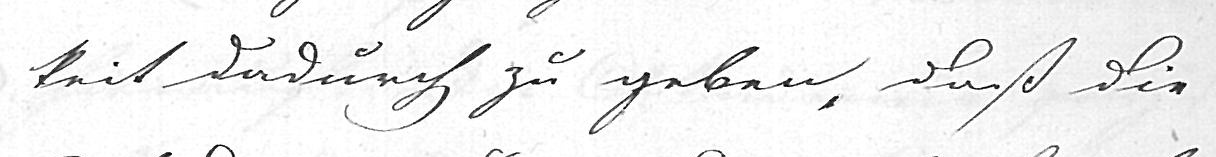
keit dadurch zu geben, daß die
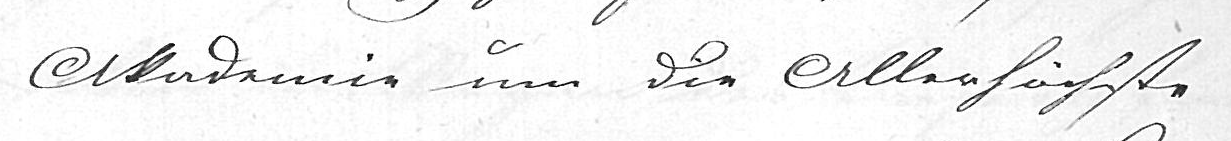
Akademie um die Allerhöchste
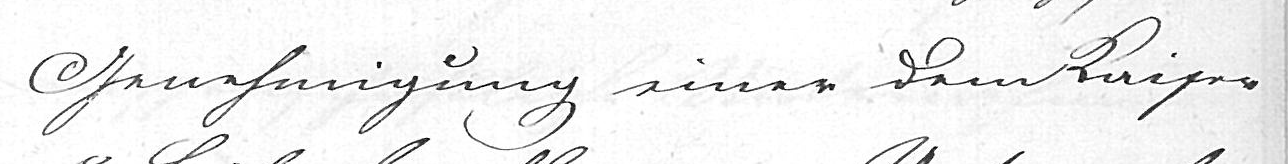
Genehmigung einer dem Kaiser
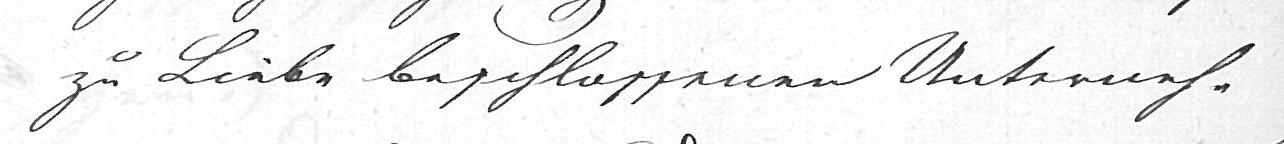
zu Liebe beschlossenen Unterneh-
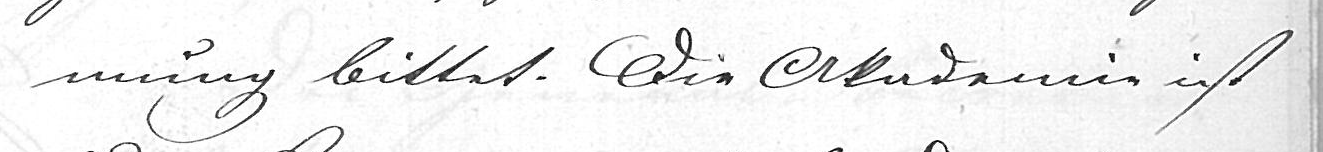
mung bittet. Die Akademie ist
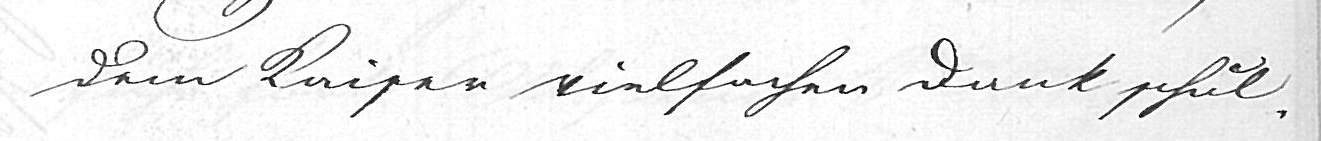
dem Kaiser vielfachen Dank schul-
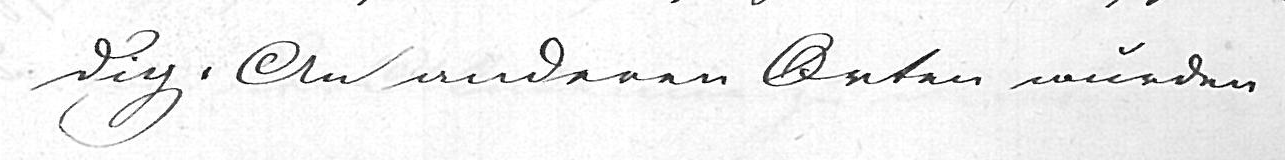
dig. An anderen Orten wurden
